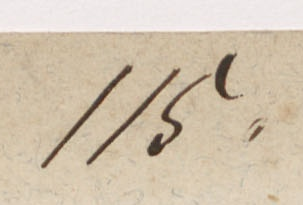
115.
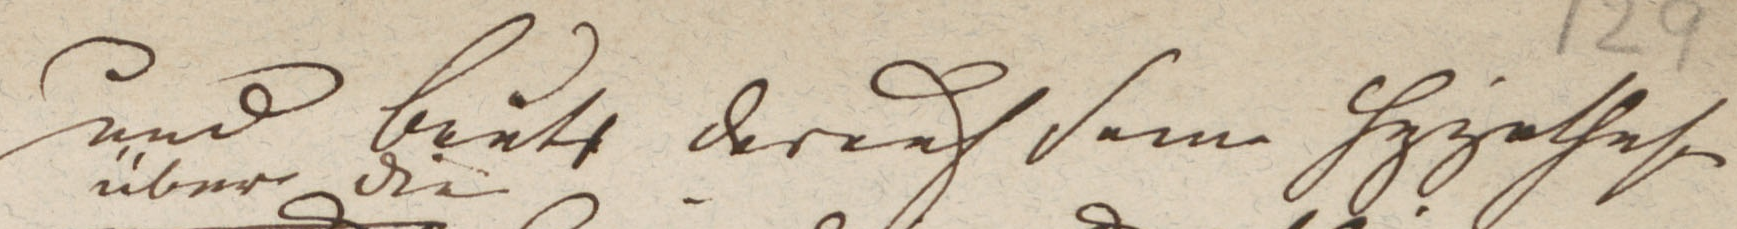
und baute darauf seine Hypothese
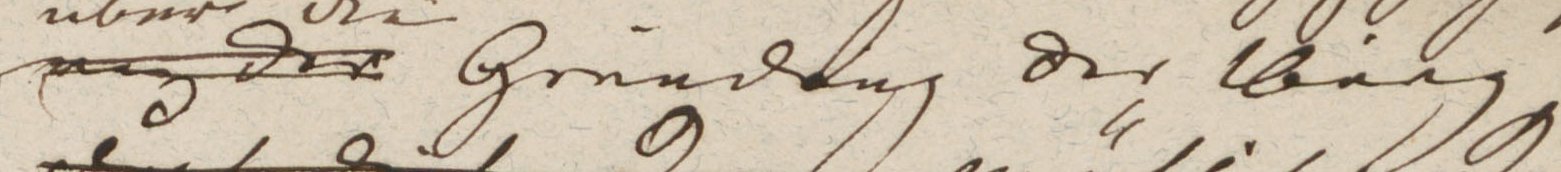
über die Gründung der Burg
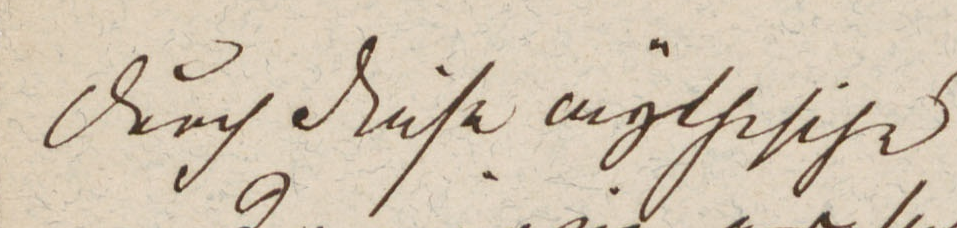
durch diese mythische
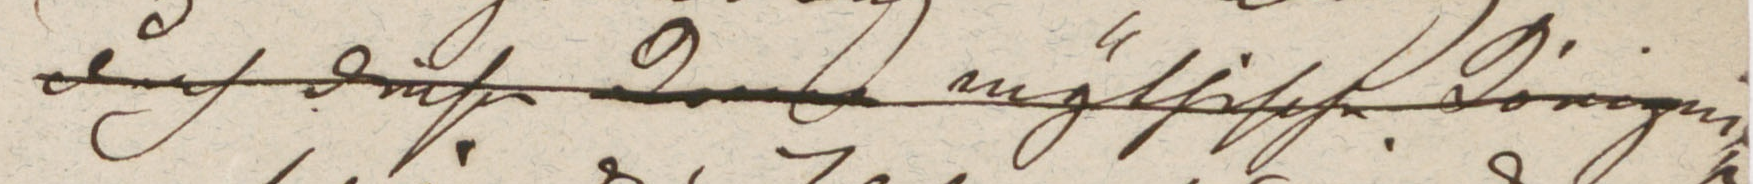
durch diese K mythische Königin
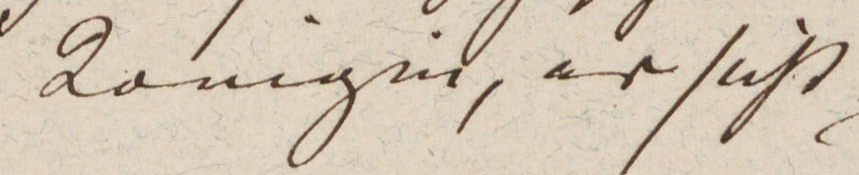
Konigin, er sieht
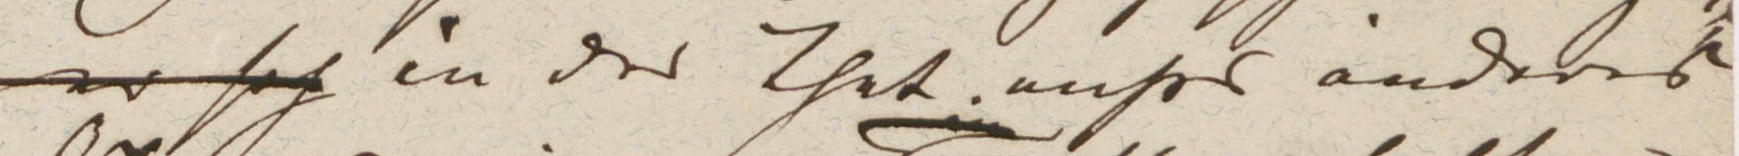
er sah in der That nichts anderes
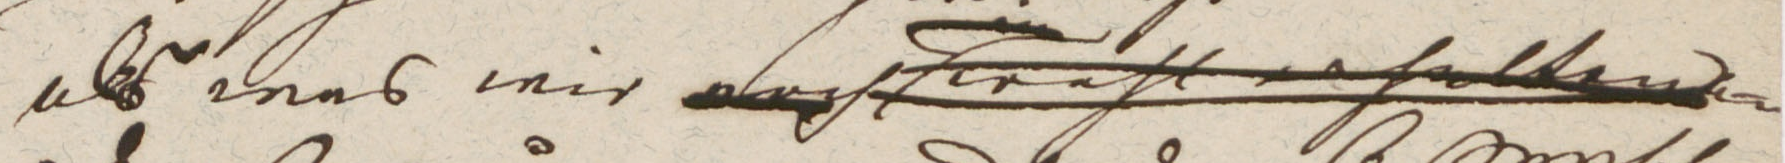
als was wir noch in wohl erhaltenen
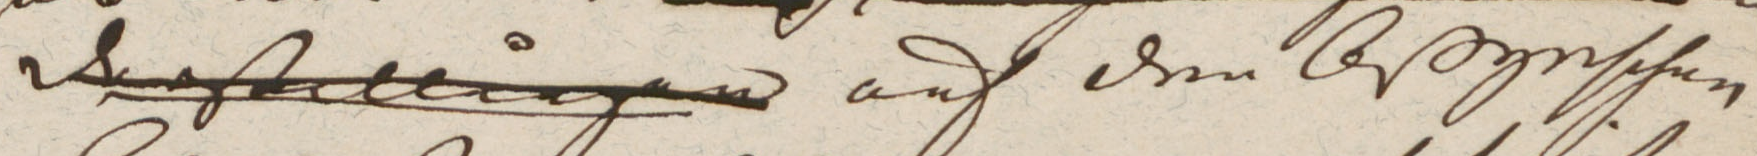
Darstellungen auf den Assyrischen
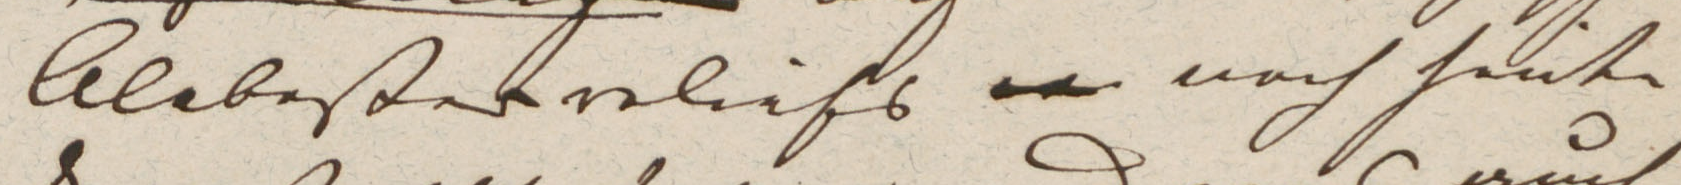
Alabasterreliefs noch heute
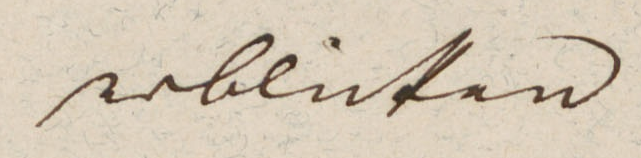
erblicken
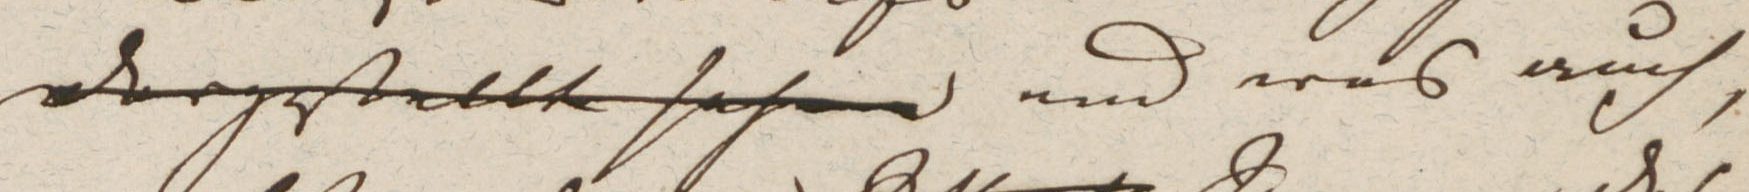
dargestellt sehen und was auch,
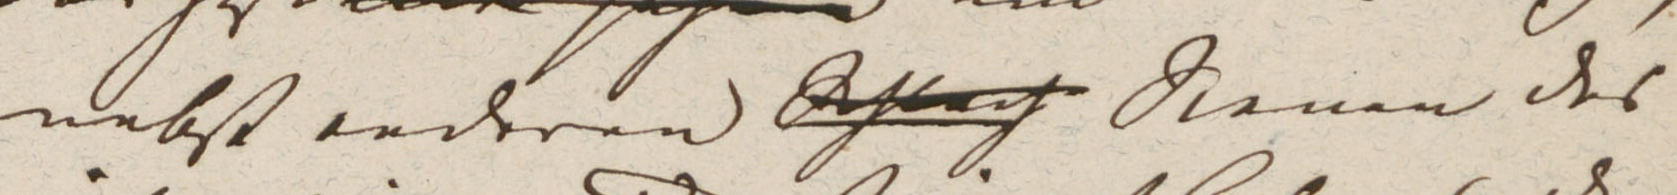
nebst anderen Schlach Scenen des
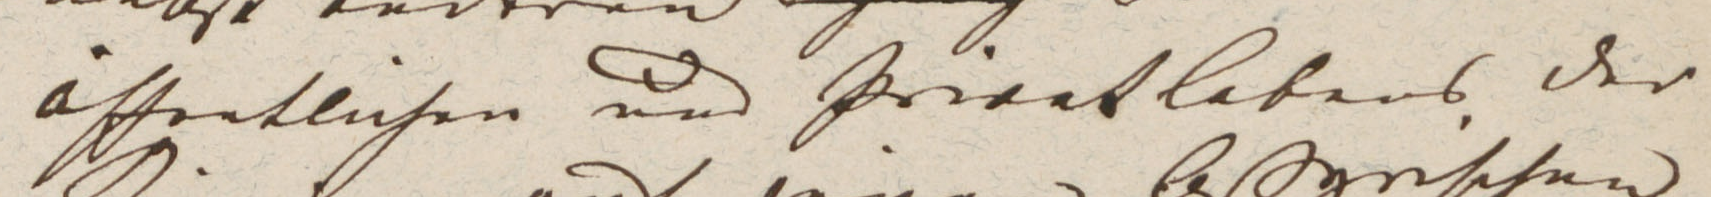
öffentlichen und Privatlebens der
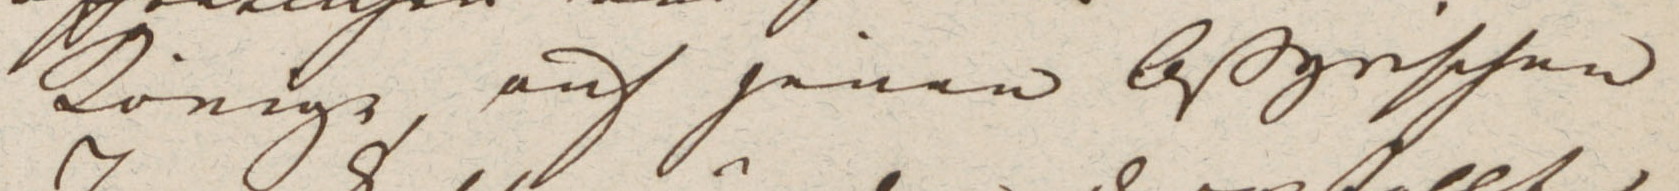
Könige, auf jenen Assyrischen
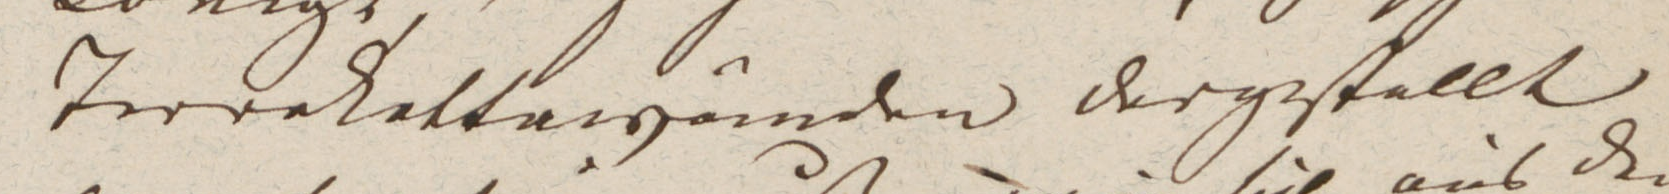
Terrakottawänden dargestellt
